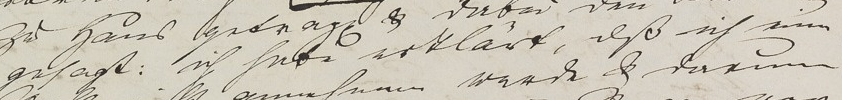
gesagt: ich habe erklärt, daß ich eine
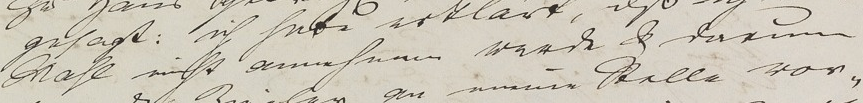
Wahl nicht annehmen werde & darum
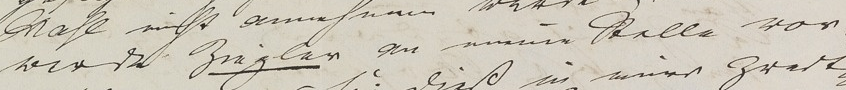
werde Ziegler an meiner Stelle vor-
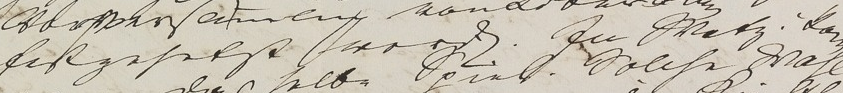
festgesetzt worden. In Wetz. kam
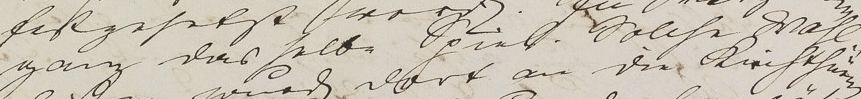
ganz das selbe Spiel. Solche Wahl-
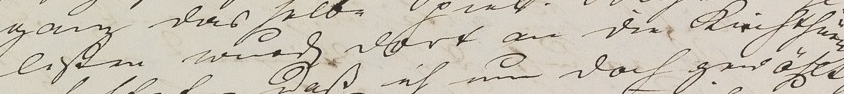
listen wurden dort an die Kirchthüren
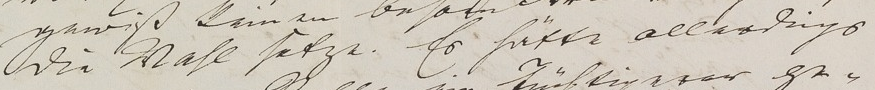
die Wahl setze. Es hätte allerdings
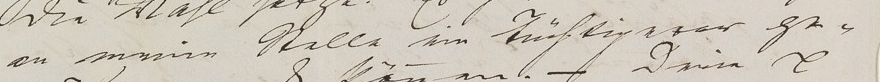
an meine Stelle ein Tüchtigerer ge-
